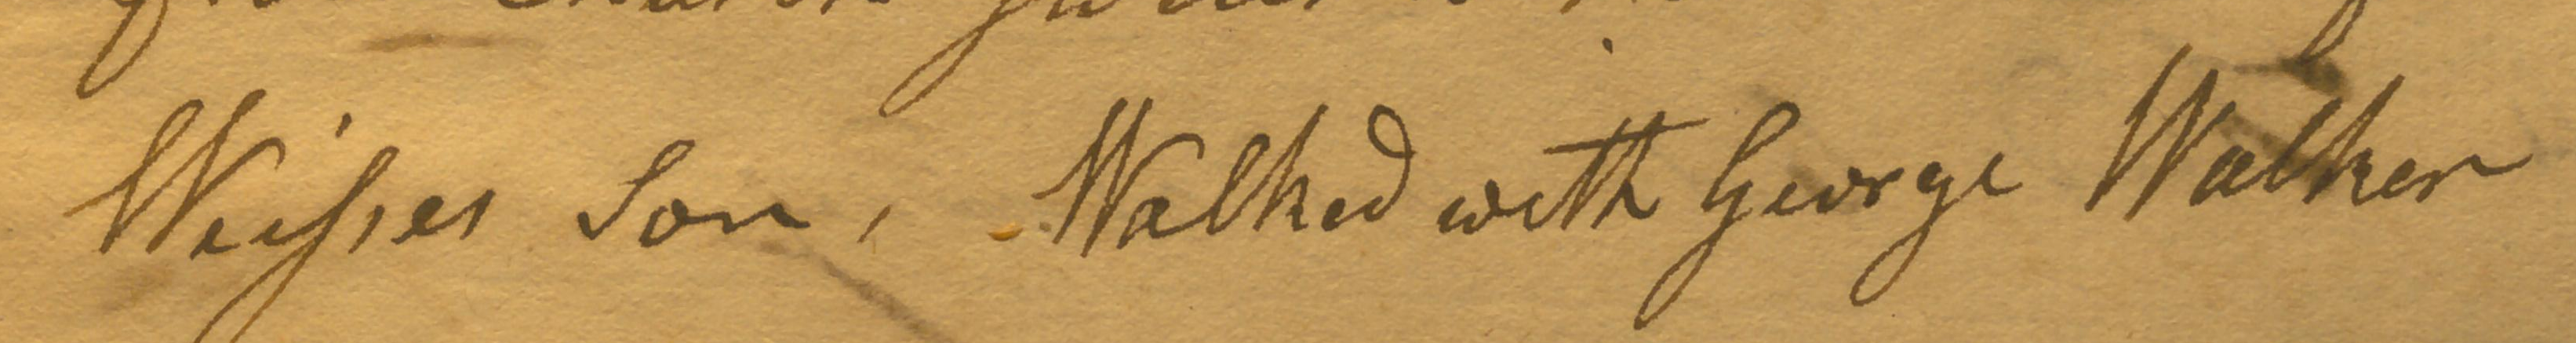Weisses son, Walked with George Walker
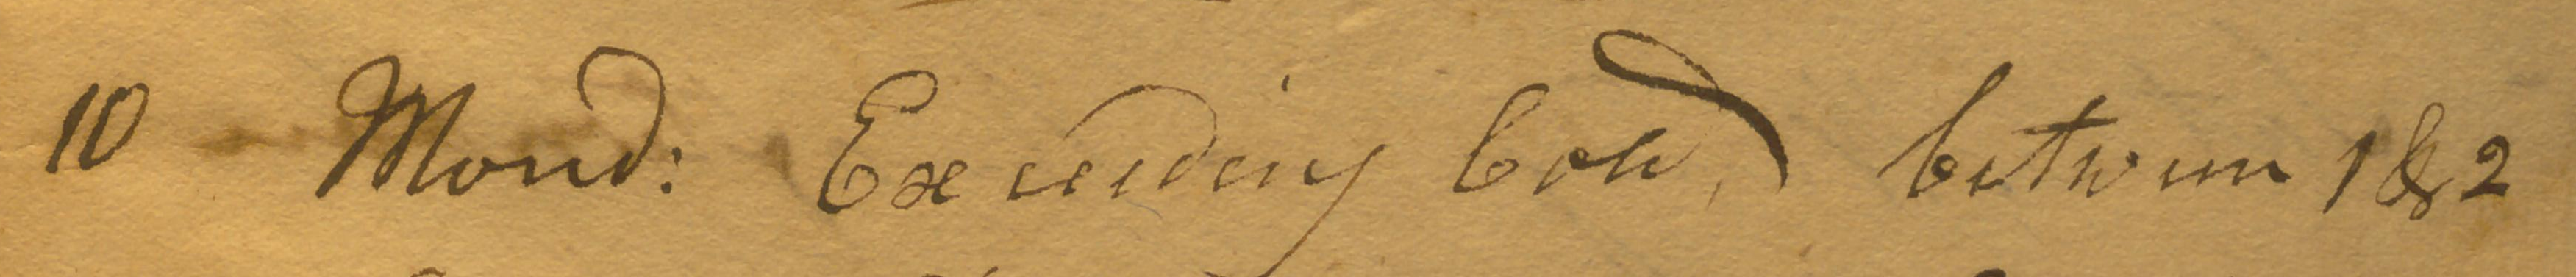10 Mond. Exceeding Cold, betwum 1 & 2
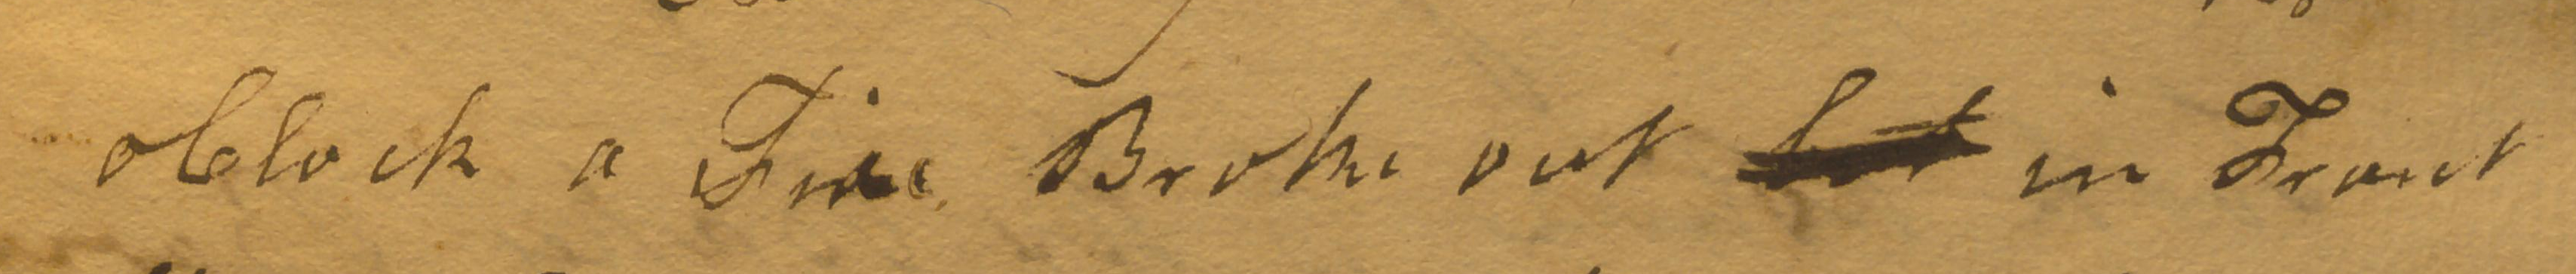oClock a Fire Broke out [bet] in Front
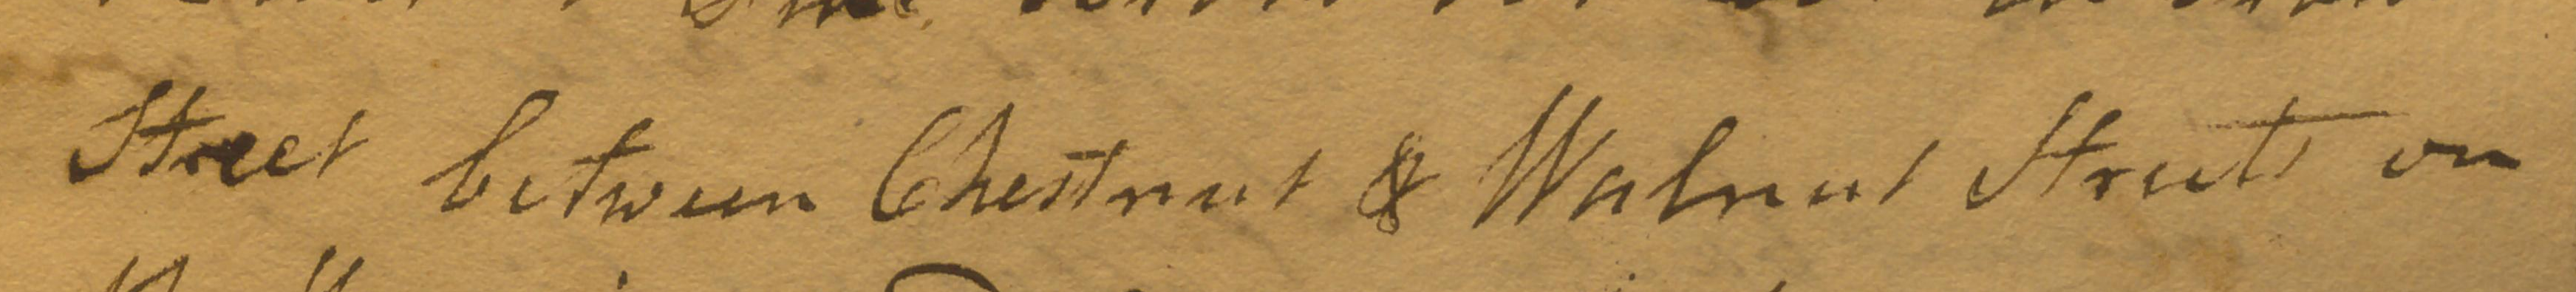Street between Chestnut & Walnut Streets on
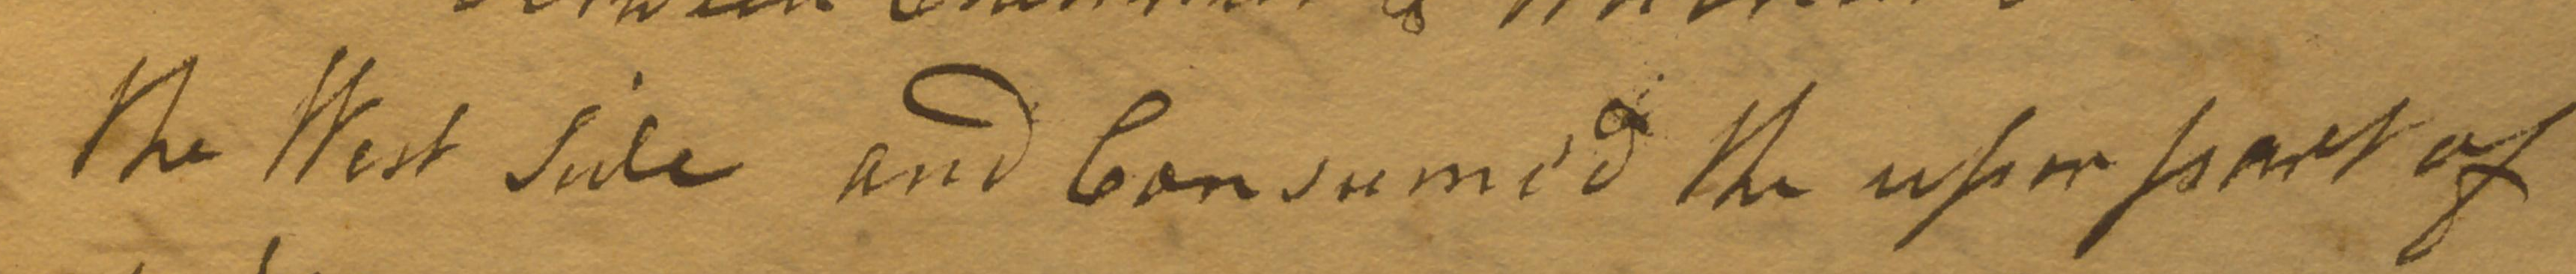the West side and Consume'd the uper part of
